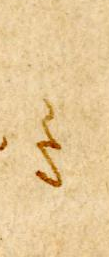in
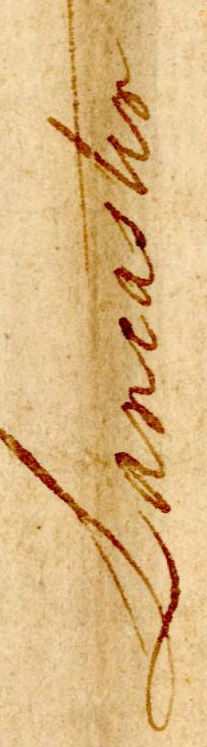Lancaster
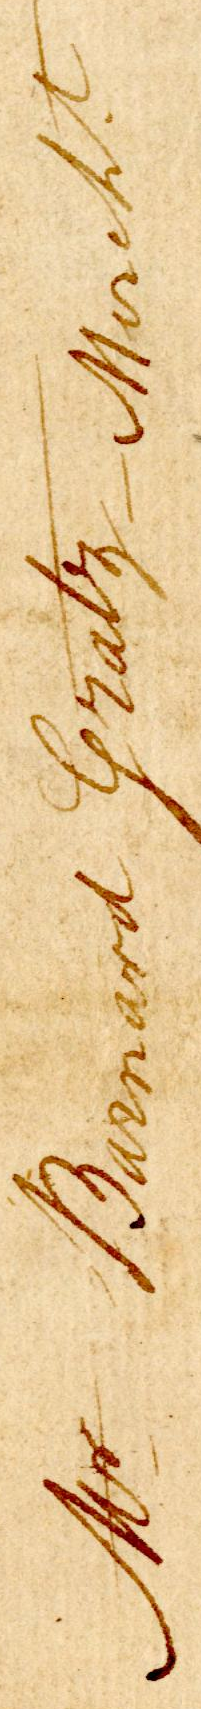M^r Barnard Gratz - Merch^t
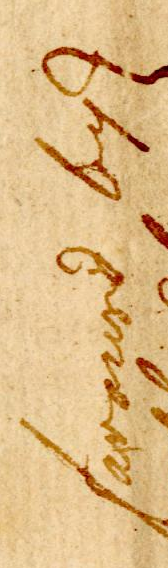favourd by
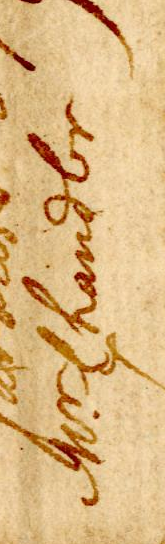M^r Chandler
